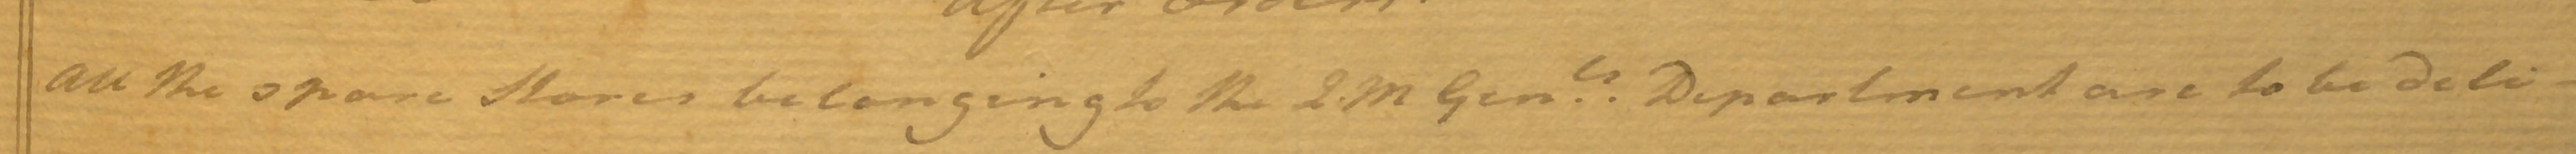all the spare Stores belonging to the QM Gen^ls. Department are to be deli-
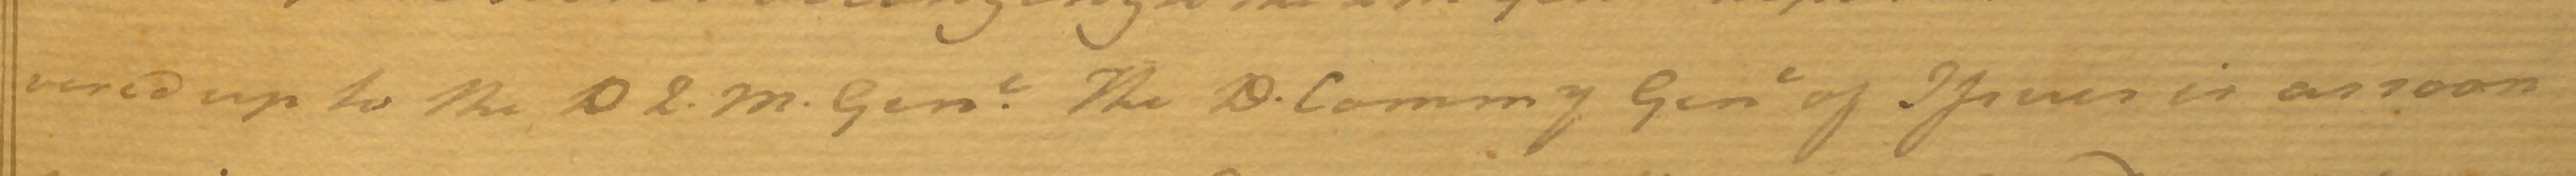vered up to the DQ. M. Gen^l. The D. Comm^y Gen^l of Issues is as soon
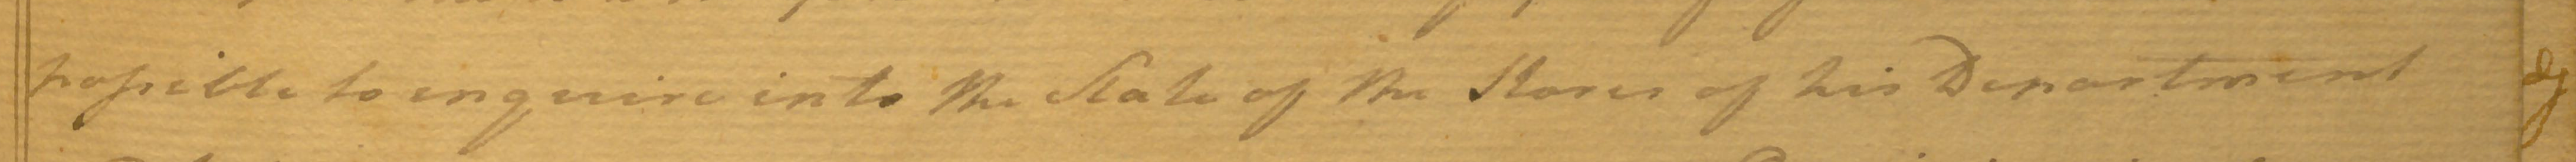possible to inquire into the State of the Stores of his Department
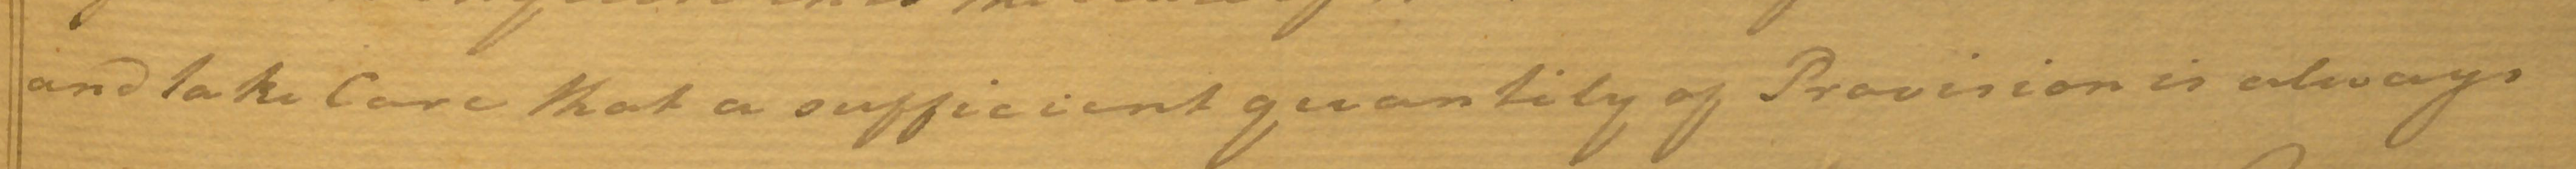and take Care that a sufficient quantity of Provision is always
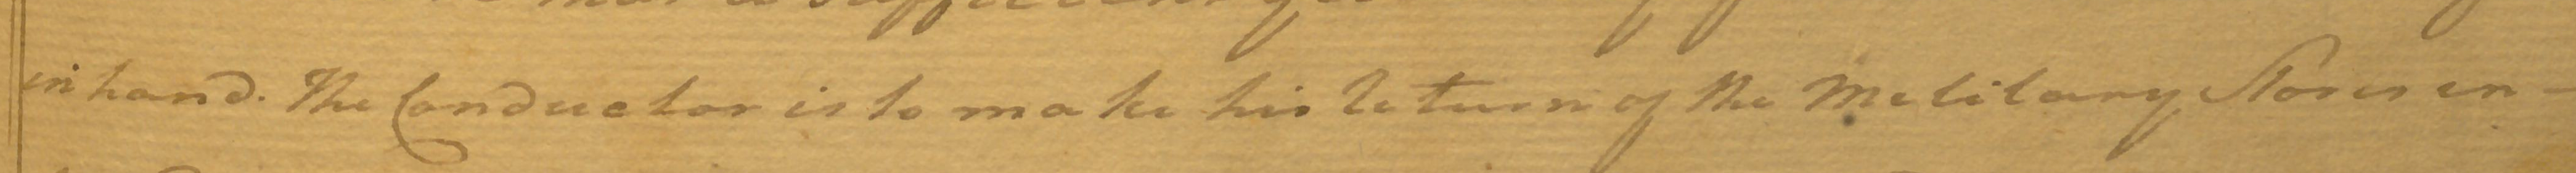in hand. The Conductor is to make his return of the Military Stores in
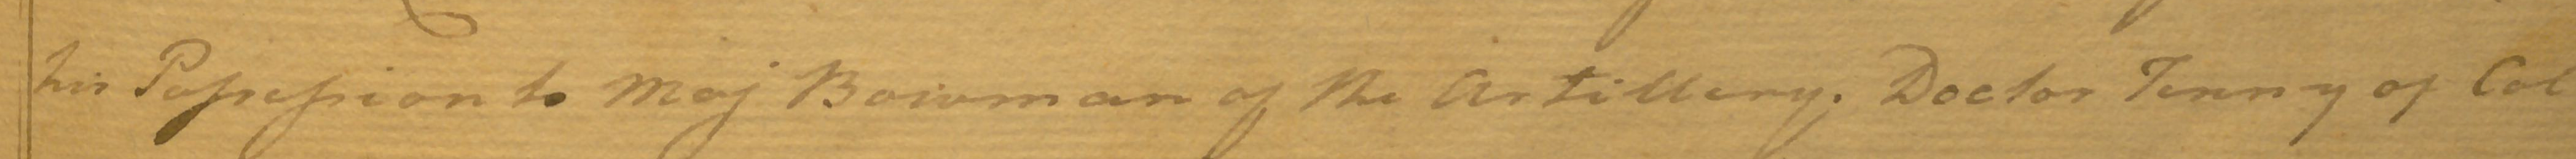his Possession to Maj Bowman of the Artillery. Doctor Tenny of Col
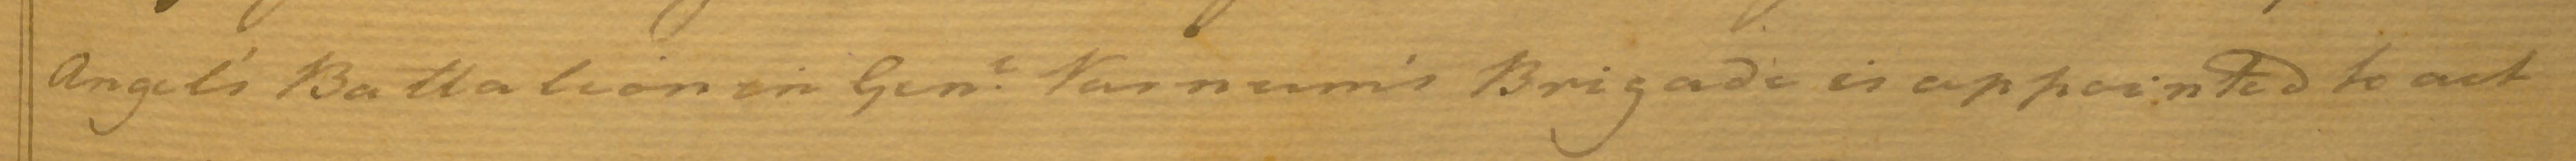Angel's Battalion on Gen^l. Varnum's Brigade is appointed to act
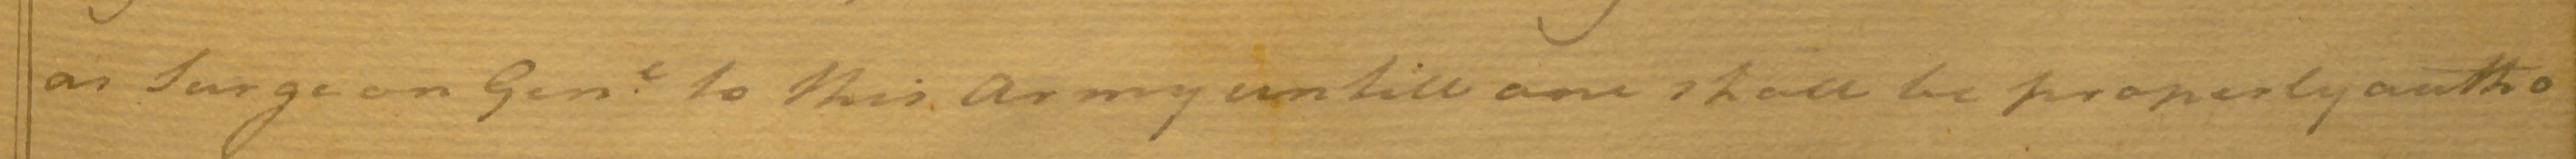as Surgeon Gen^l. to this army untill one shall be properly autho
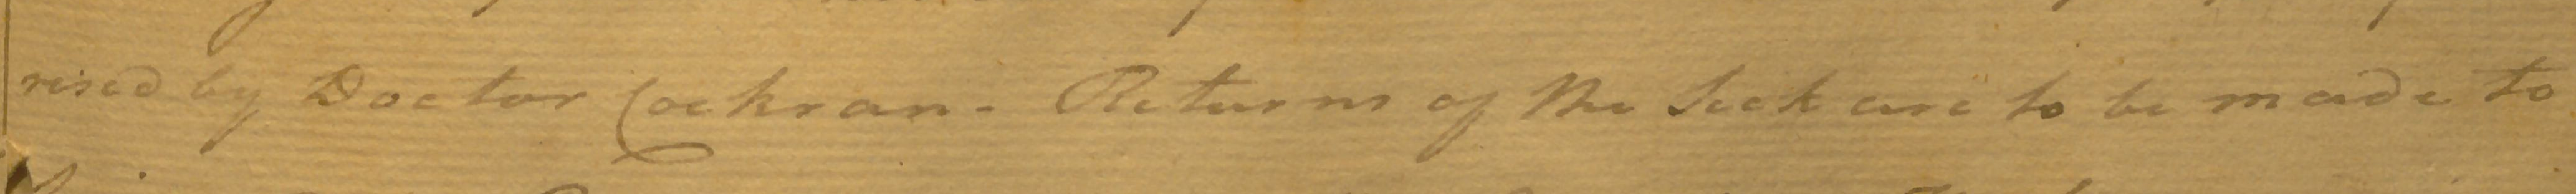rised by Doctor Cochran. Returns of the Sick are to be made to
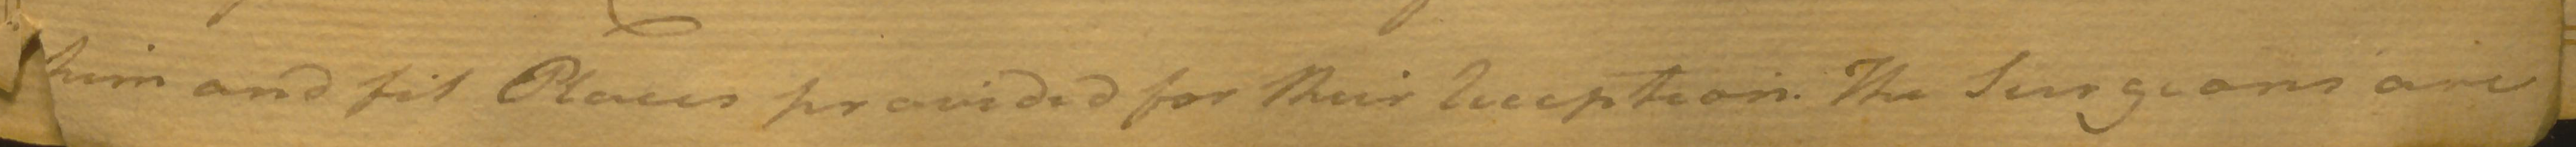him and fit Places provided for their reception. The Surgeons are
